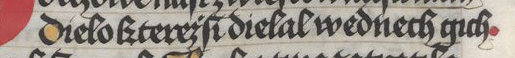dielo ktereżſi dielal wednech gich.
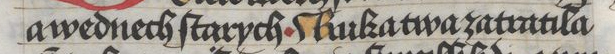a wednech ſtarych.Muka twa zatratila
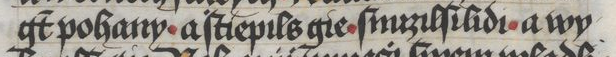ḡt pohany.a ẛtíepils gie.ſnuzilſilidi.a wy¬
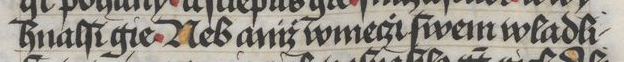hnalſi gie.Neb aniż wmecżi ſwem wladli
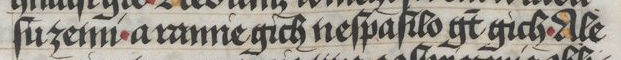ſu zemí.a ramie gich neſpaſilo ḡt gich.Ale
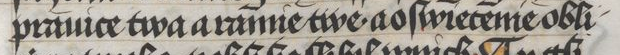prauice twa a ramie twe.a o ſwieteníe obli¬
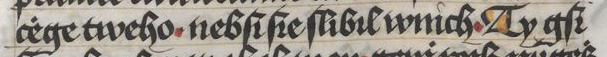ċege tweho.neb ſi ſie ſlibil wnich.Ty gſi
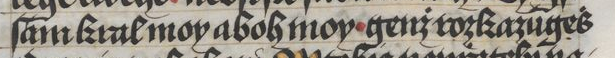ſam kral moy a boh moy.genż rozkazugeṡ
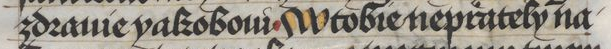zdrauie yakoboui.W tobie nepṙately na¬
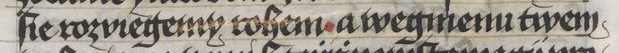ẛie rozviegemy rohem.a wegmenu twem
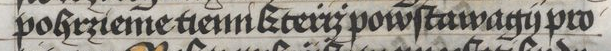pohrzíeme tiemi kteṙíż powſtwagij pro¬
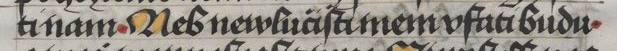ti nam.Neb newlučiẛti mem vſati budu.
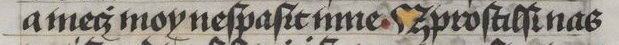a mecż moy neſpaſit mne.Zproſtilſi nas
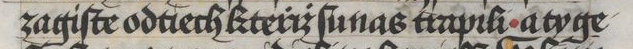zagiſte odtiech kteṙiż ſu nas trapili.a ty ge¬
